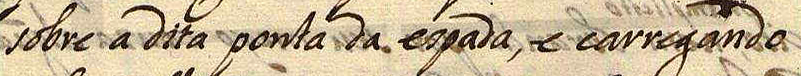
sobre a dita ponta da espada, e carregando
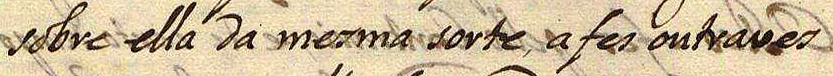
sobre ella da mesma sorte, a fes outra ves
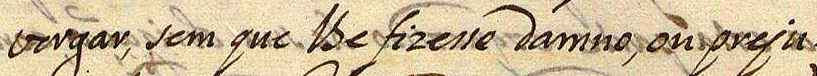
vergar, sem que lhe fizesse damno, ou preju
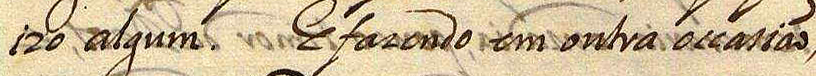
izo algum. E fazendo em outra occasião,
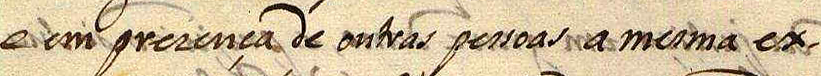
e em prezença de outras pessoas a mesma ex
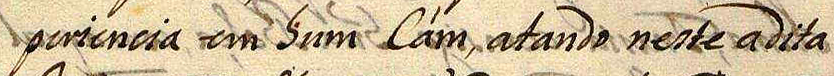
periencia em hum Cám, atando neste a dita
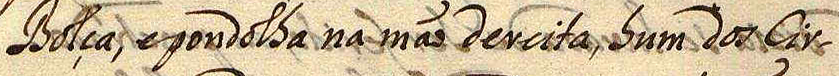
Bolça, e pondolha na mão dereita, hum dos Cir
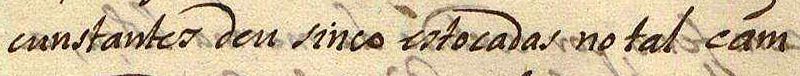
cunstantes deu sinco estocadas no tal cám
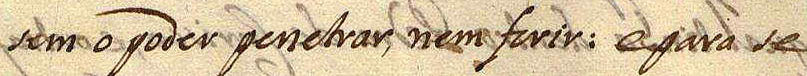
sem o poder penetrar, nem ferir: e para se
